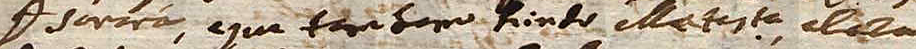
q̄ sarará, e que também hindo ella test.a, a Caza
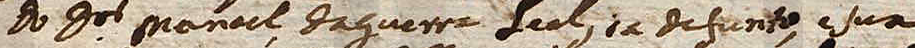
Do D.or manoel da guerra leal, ia defunto, e sua
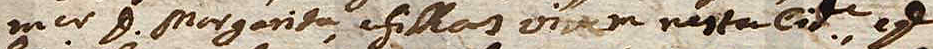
m.er D. margarida, e filhas vivem nesta Cid.e e q̄
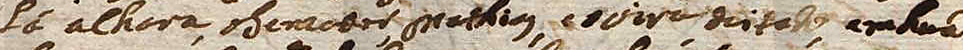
Lá achara o benzedor, mathias, e o vira deitado, em huā
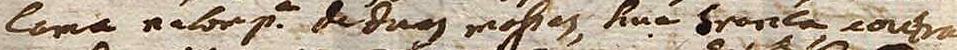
Cama na Comp.a de duas mossas, huā branca, e outra
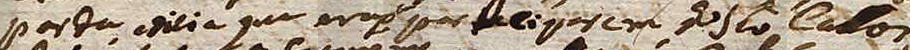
parda, e dizia que era p.a participarem do seo Callor
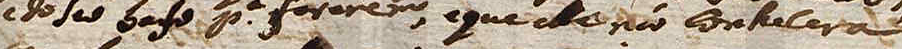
e do seo bafo p.a sararem, e que ella naõ conhecera
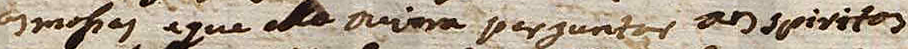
as mossas, e que ella ouvira perguntar aos spiritos
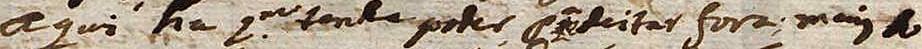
aqui ha q.m tenha poder, p.a deitar fora; mais do
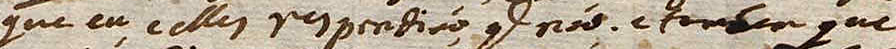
que eu, e elles respondiaõ q̄ não; e tambem que
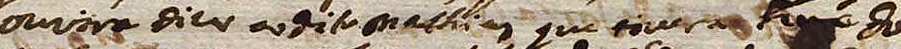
ouvira dizer ao dito mathias que tivera huā do
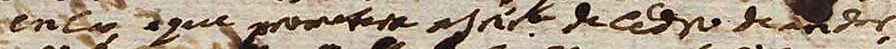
ença, e que prometera a Sn̄r.a do cedro de andar,
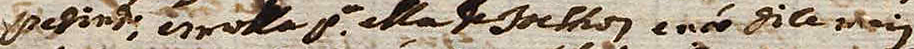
pedindo esmolla p.a ella de joelhos, e naõ dice mais
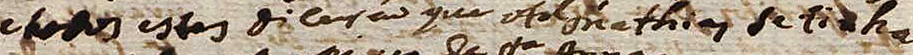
e todos estas dicerão que o tal mathias se tinha
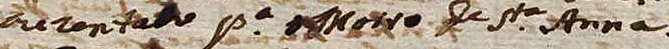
auzentado p.a o Morro de Sta. Anna.
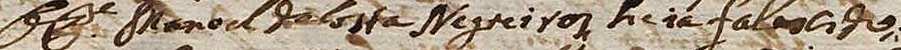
o P.e Manoel da Costa Negreiros he iá falescido;
